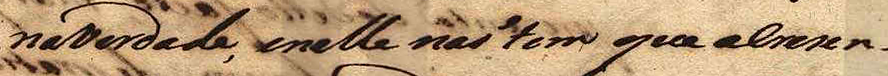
na verdade, e nelle naõ tem que aCrescen
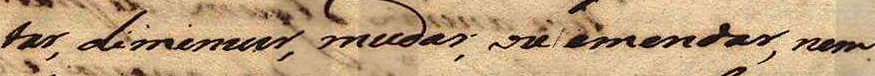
tar, diminuir, mudar ou emendar, nem
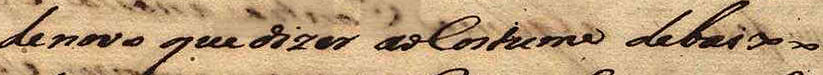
de novo que dizer ao Costume debaixo
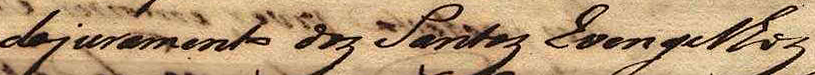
do juramento doz Santoz Evangelhoz
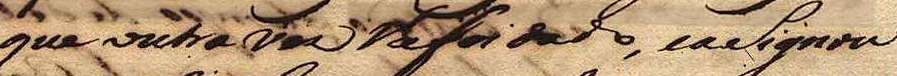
que outra vez lhe foi dado, e aSignou
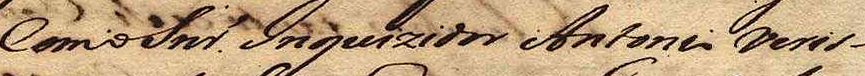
Com o Snr̄ Inquizidor Antonio veris
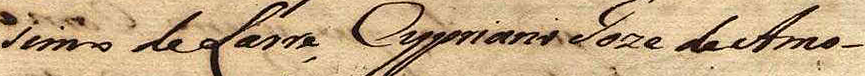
simo de Larre, Cypriano Ioze de Amo
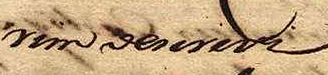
rim o escrevi
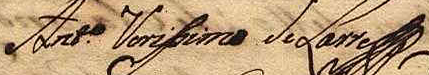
Ant.o Verissimo de Larre
